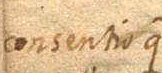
consentio q̄
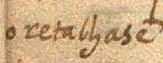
o retalhasē
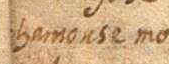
chamouse mo
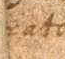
rato.
